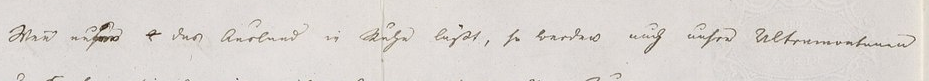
Wenn unser & das Ausland in Ruhe läßt, so werden auch unsre Ultramontanen
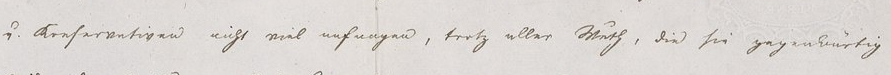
u. Konservativen nicht viel anfangen, trotz aller Wuth, die sie gegenwärtig
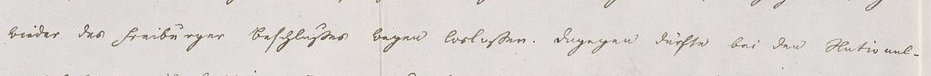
wieder des Freiburger Beschlusses wegen loslassen. Dagegen dürfte bei den National-
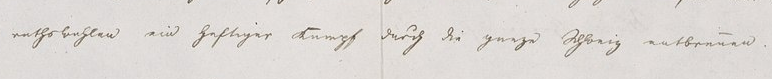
rathswahlen ein heftiger Kampf durch die ganze Schweiz entbrennen.
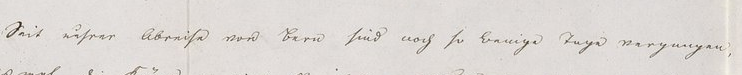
Seit unsrer Abreise von Bern sind noch so wenige Tage vergangen,
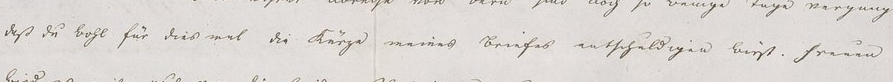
daß Du wohl für diesmal die Kürze meines Briefes entschuldigen wirst. Freuen
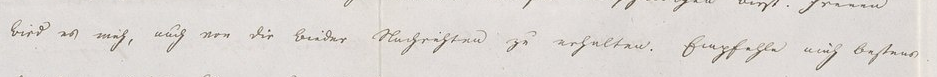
wird es mich, auch von Dir wieder Nachrichten zu erhalten: empfehle mich bestens
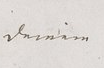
Deinem
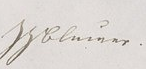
J J Blumer.
